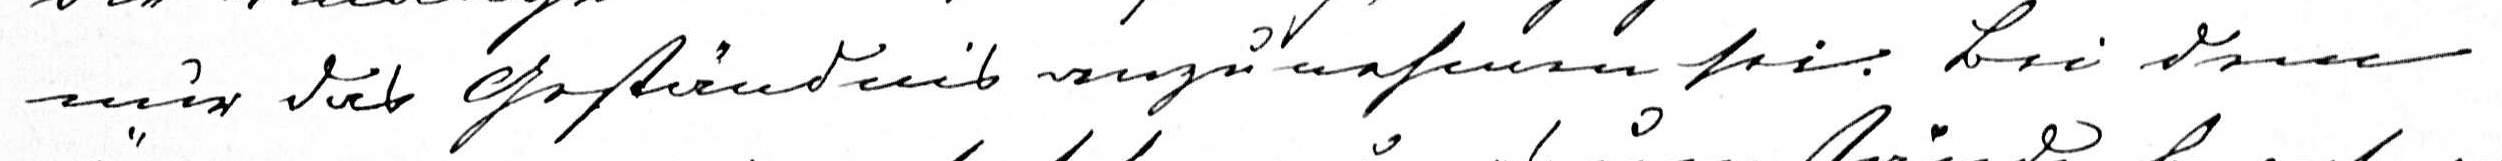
nur das Geständnis anzunehmen sei. Bei den
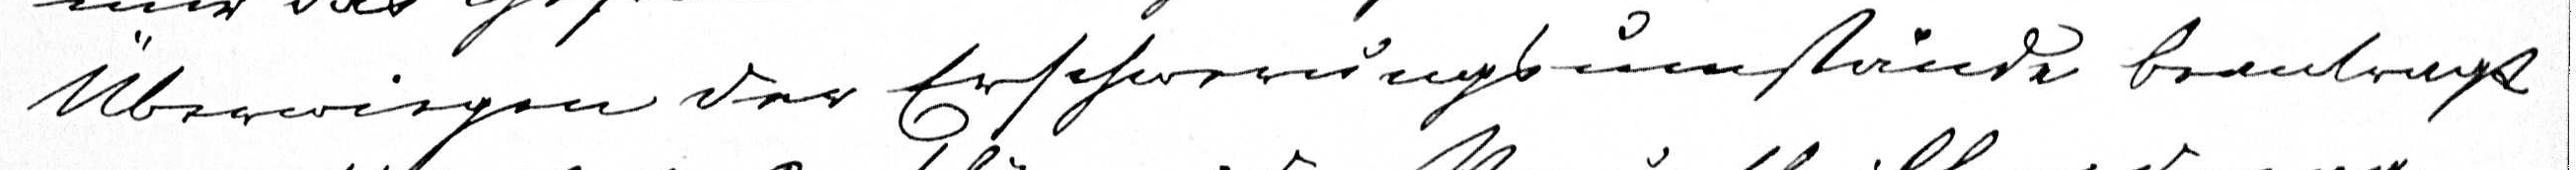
Überwiegen der Erschwerungsumstände beantragt
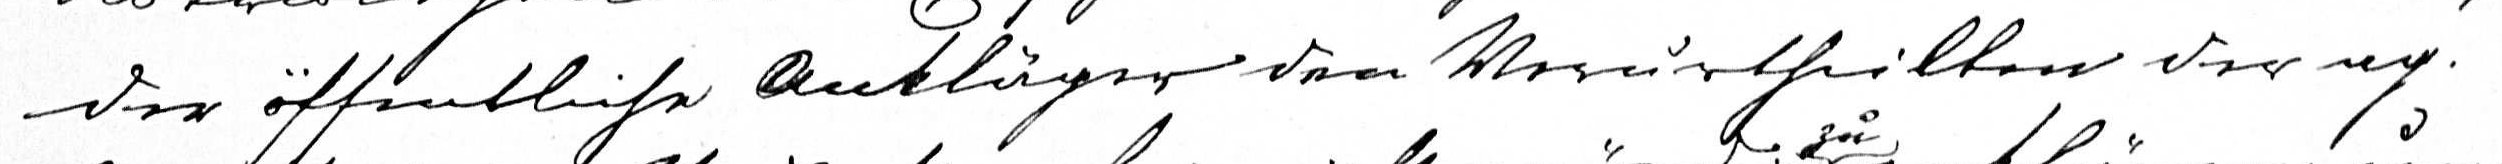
der öffentliche Ankläge den Verurtheilten der ag.
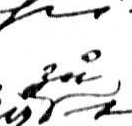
zu
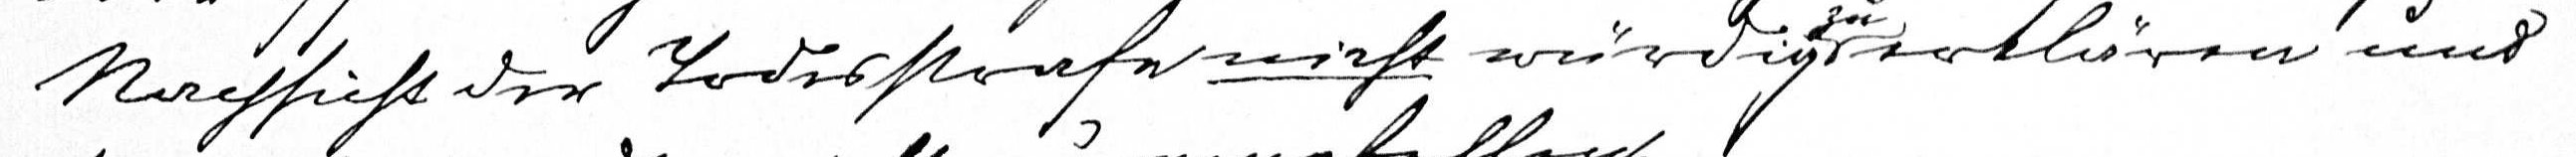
Nachsicht der Todesstrafe nicht würdig erklären und
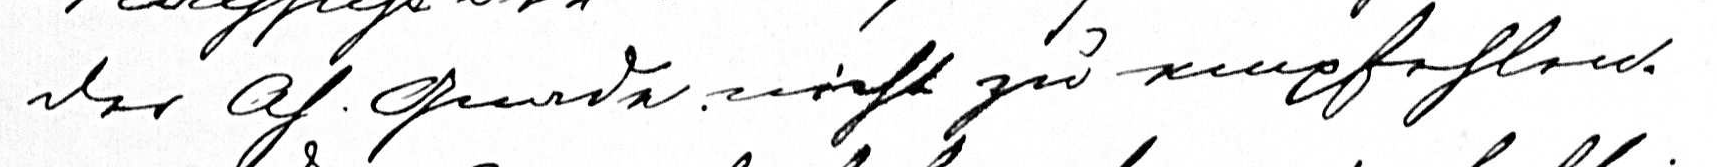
der Ah. Gnade nicht zu empfehlen.
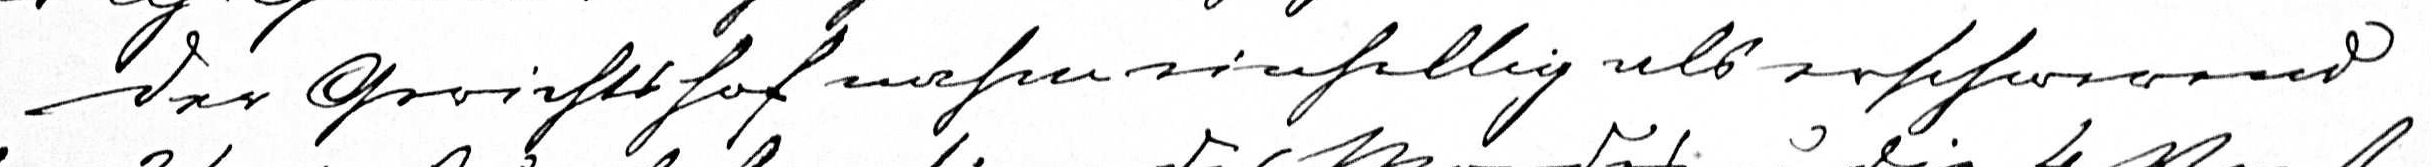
Der Gerichtshof nahm einhellig als erschwerend
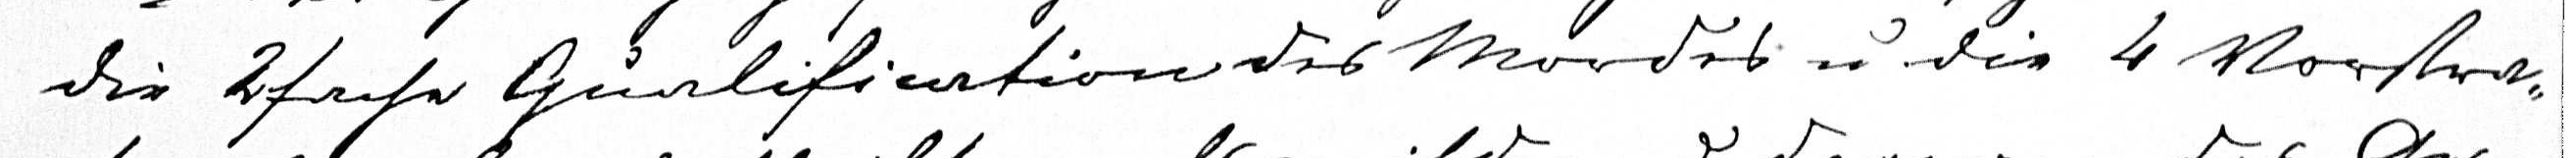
die 2fache Qualification des Mordes u. die 4 Vorstra¬
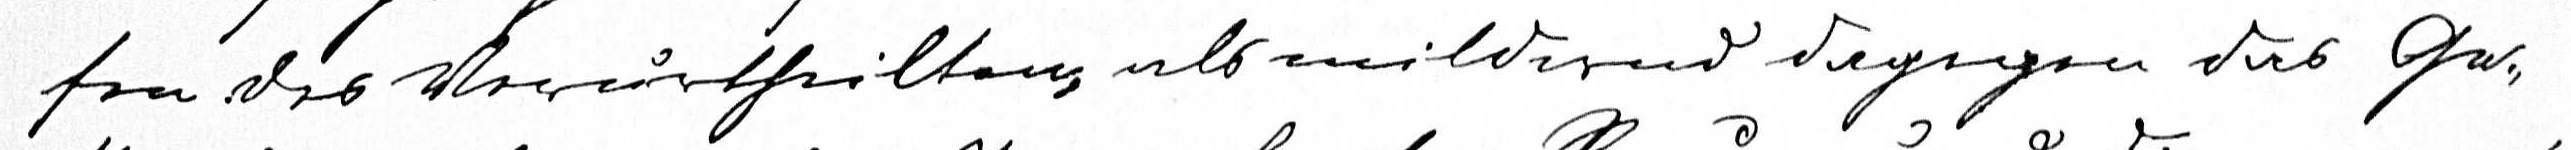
fen des Verurtheilten, als mildernd dagegen das Ge¬
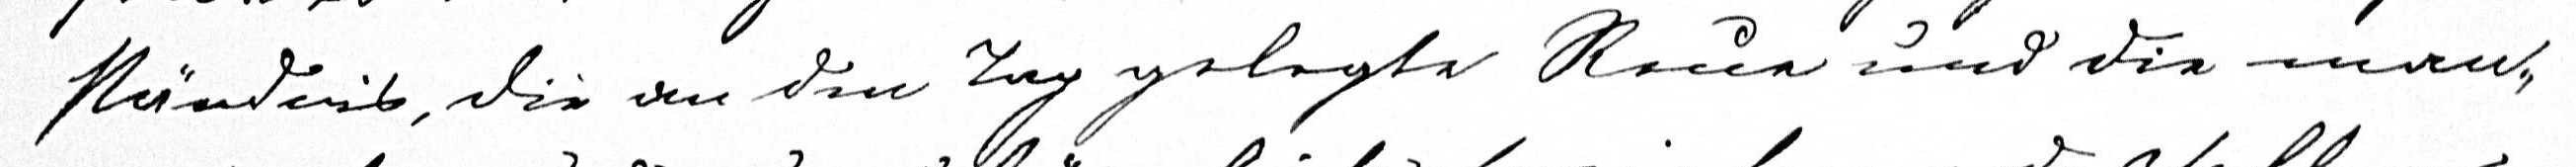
ständnis, die an den Tag gelegte Reue und die man¬
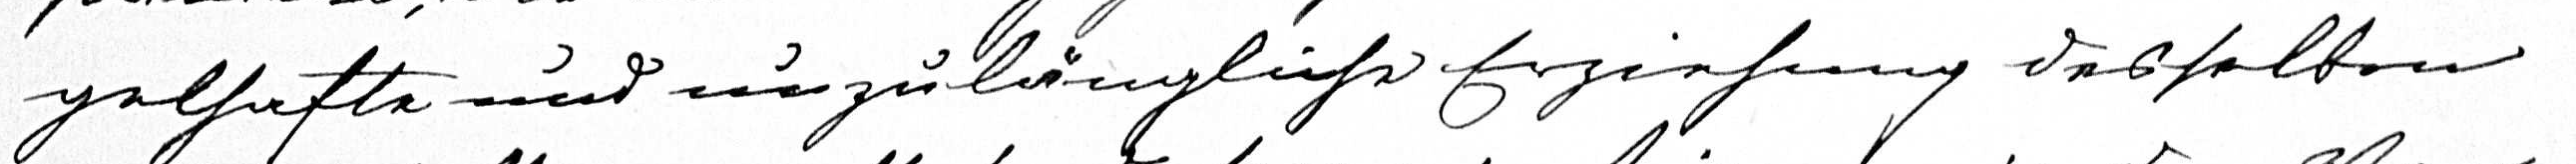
gelhafte und unzulängliche Erziehung desselben
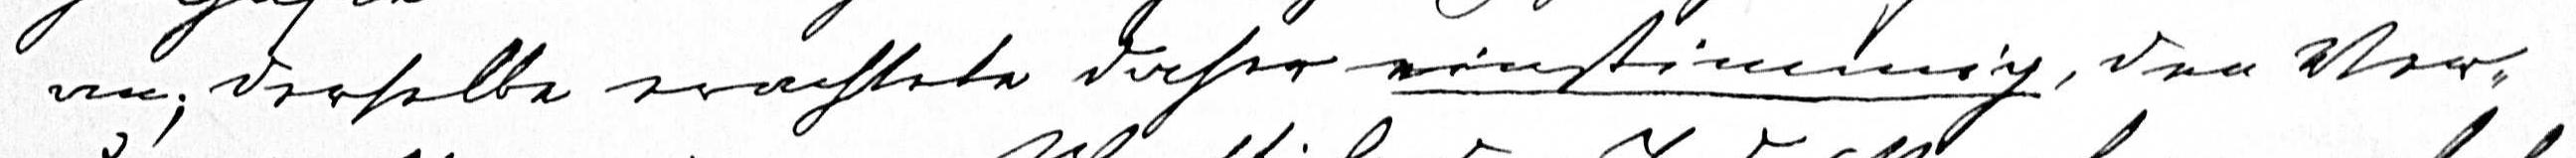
an; derselbe erachtete daher einstimmig, den Ver¬
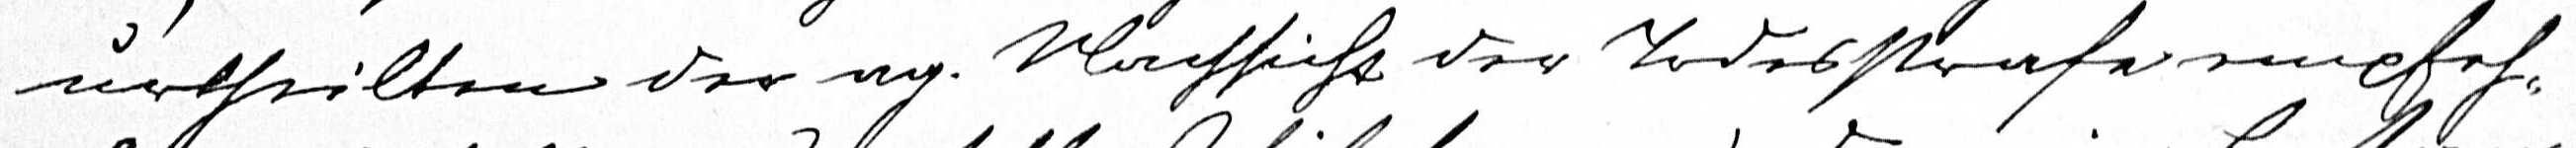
urtheilten der ag. Nachsicht der Todesstrafe empfeh¬
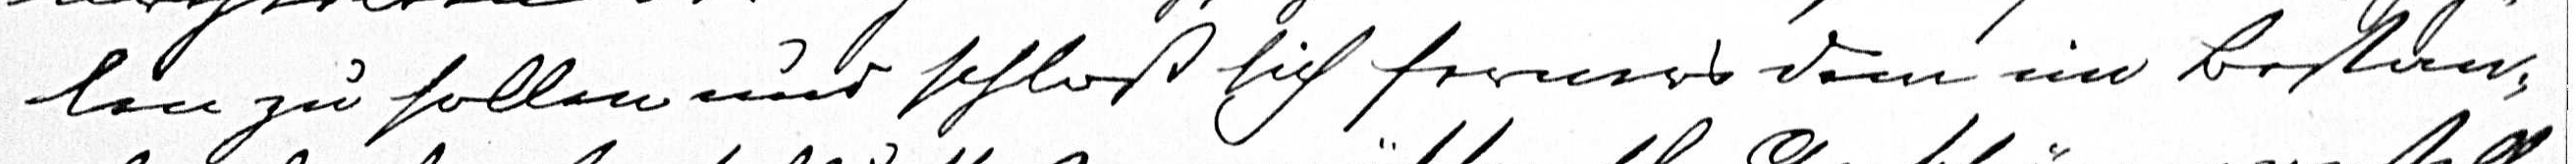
len zu sollen und schloß sich ferners dem im Bestän¬
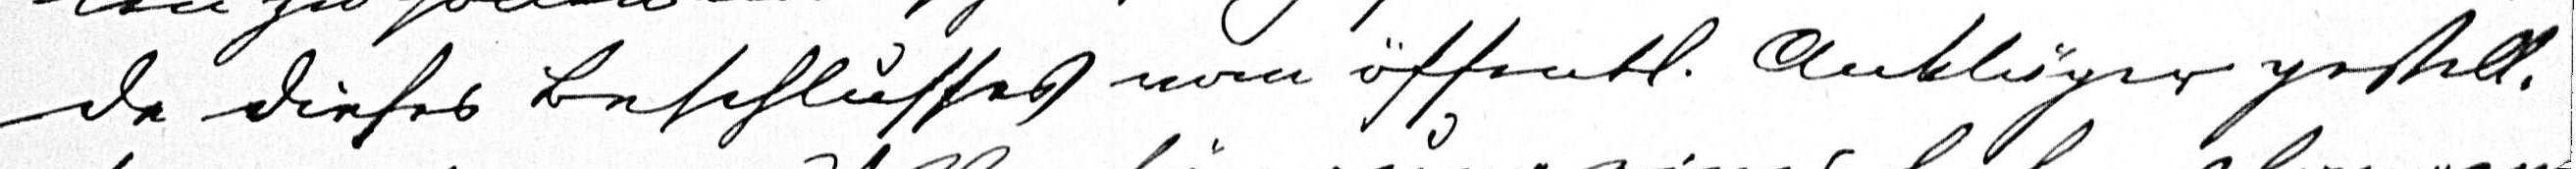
de dieses Beschlusses vom öffentl. Ankläger gestell¬
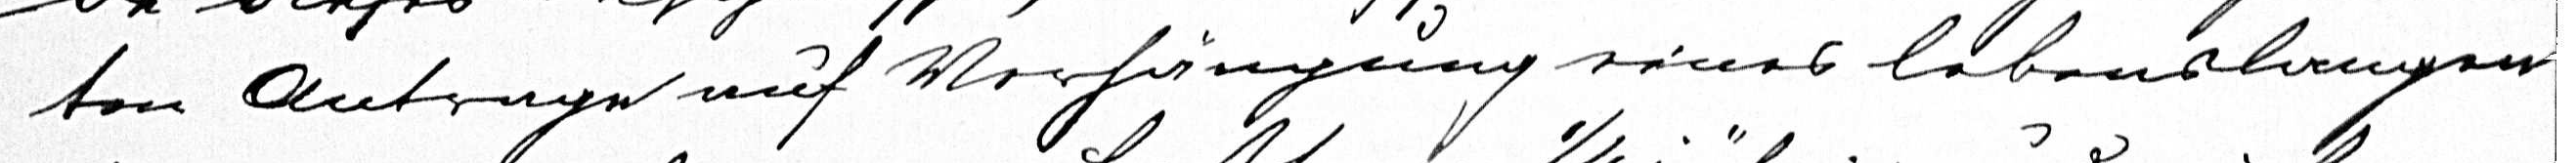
ten Antrage auf Verhängung eines lebenslangen
